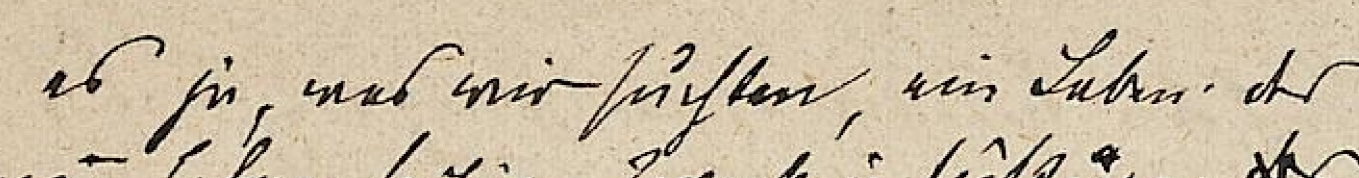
es ja, was wir suchten, ein Leben das
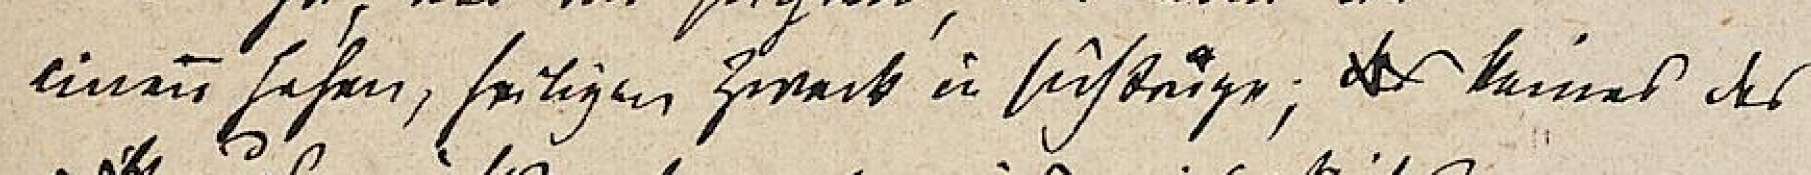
einen hohen, heiligen Zweck in sich trage, das keines des
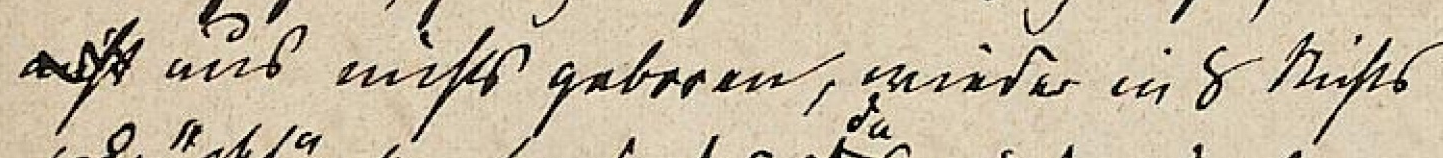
nicht aus nichts geboren, wieder in's Nichts
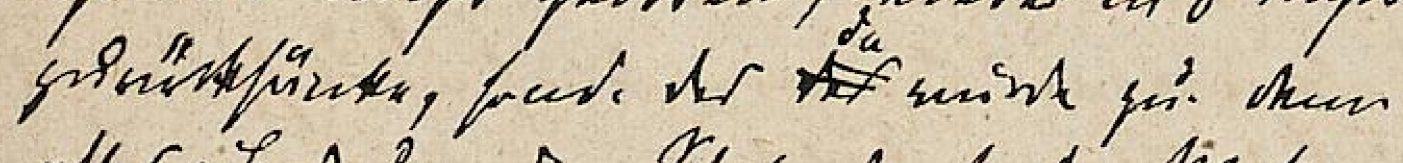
zurücksänke, sond. der des würde zu dem
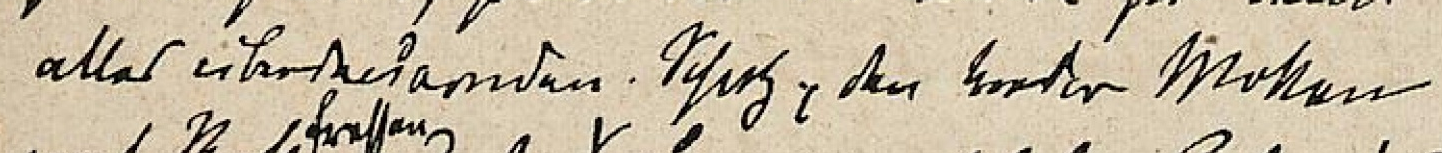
alles überdauernden. Schatz , den weder Motten
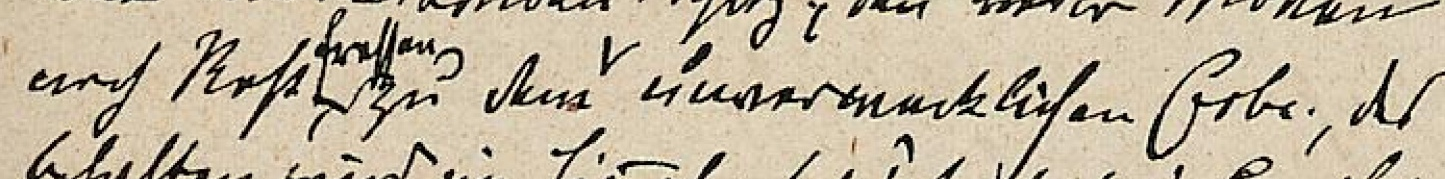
noch Rost de dee unwermnckelichen Erbe, ds
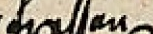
fressen
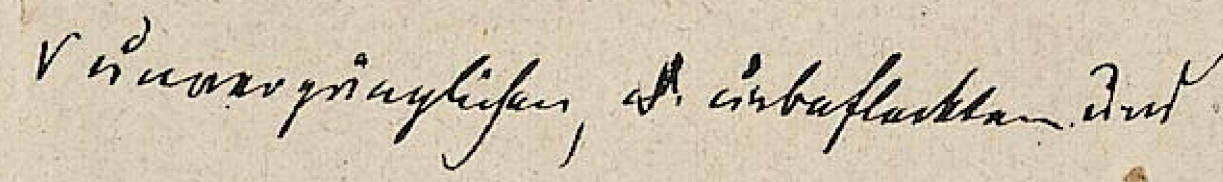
V unvergänglichen, d. unbefleckten und
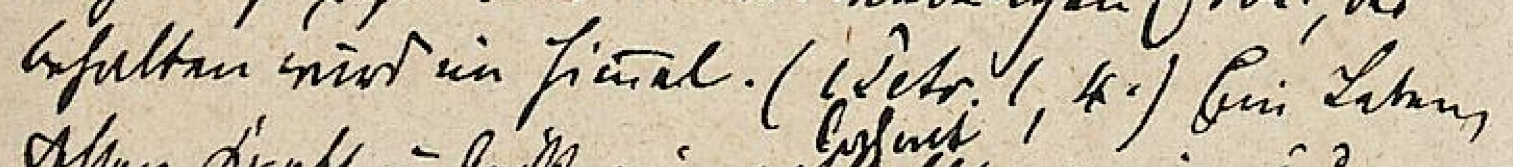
behalten wird im Himel (1 Petr. 1,4.) Ein Leben,
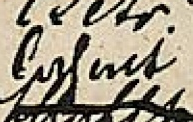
lahmt
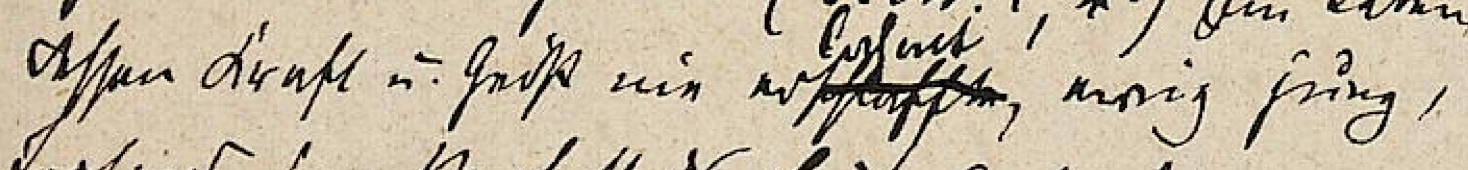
dessen Kraft u. Geist ein erschlaffte, ewig jung,
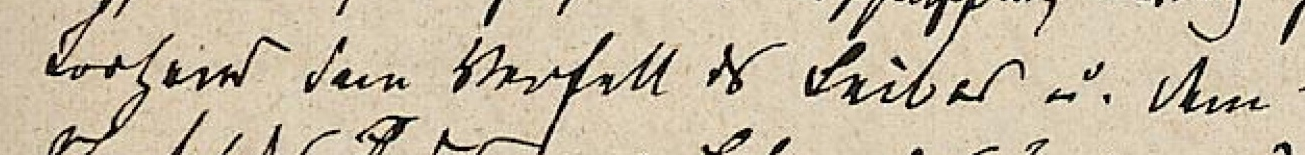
trotzend dem Verfall ds Leibes u. dem
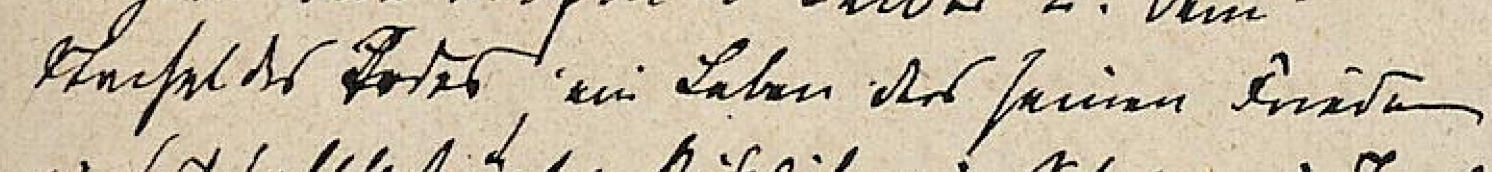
Stachel des Todes, ein Leben das seinen Frieden
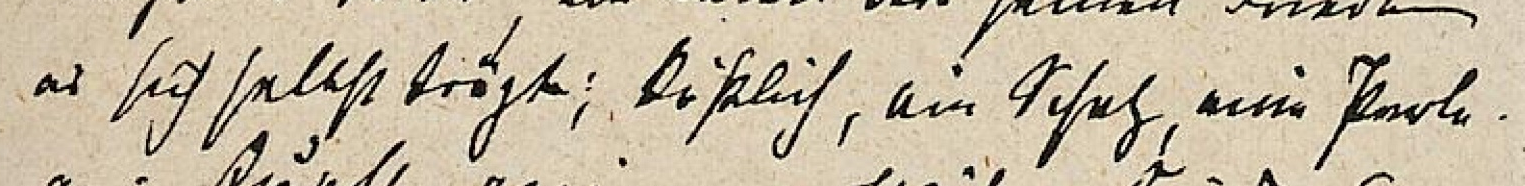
in sich selbst trägte; köstlich, ein Schatz, eine Perle.
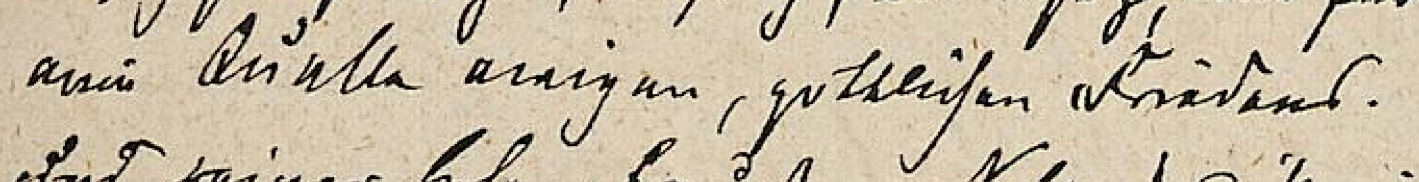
eine Quelle ewinigen, göttlichen Friedens.
